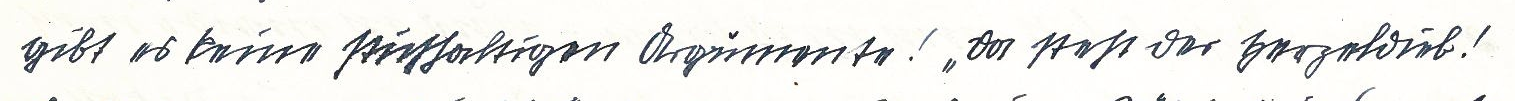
gibt es keine stichhaltigen Argumente! „Da steht der Herzeldieb!
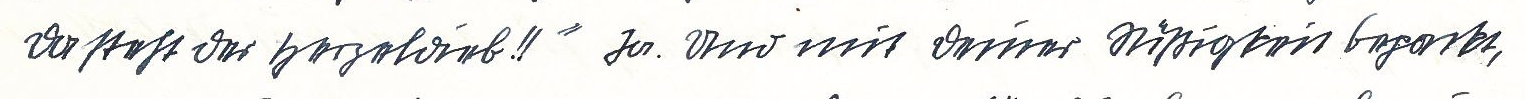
Da steht der Herzeldieb!!“ Ja. Und mit Deiner Süßigkeit bepackt,
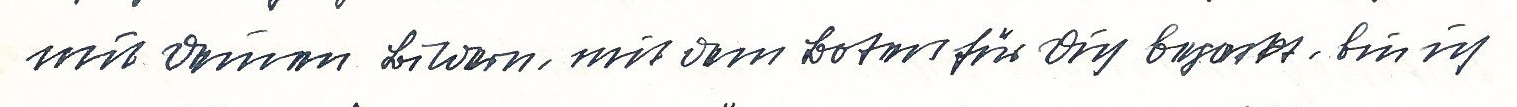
mit Deinen Bildern, mit dem Boten für Dich bepackt, bin ich
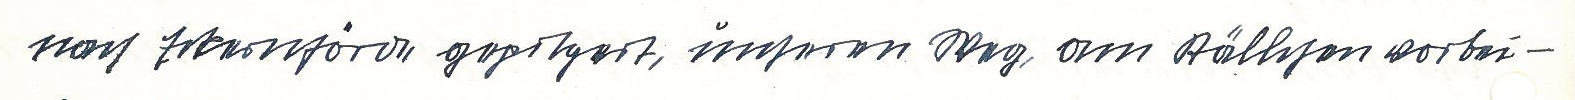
nach Eckernförde gepilgert, unseren Weg, am Ställchen vorbei –
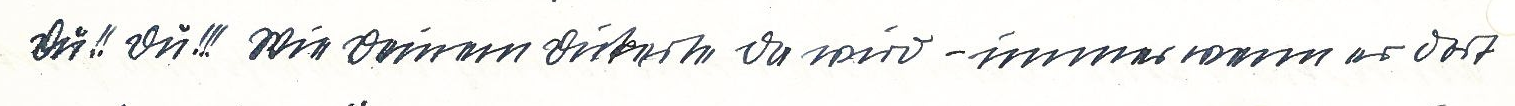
Du!! Du!!! Wie Deinem Dickerle da wird – immer wenn er dort
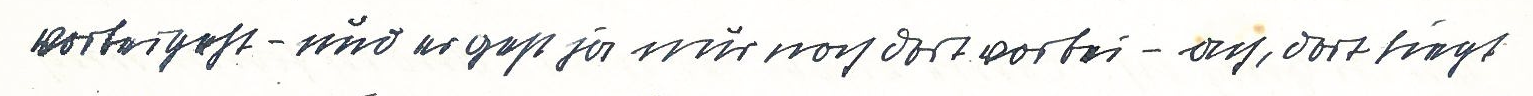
vorbeigeht – und er geht ja nur noch dort vorbei – ach, dort liegt
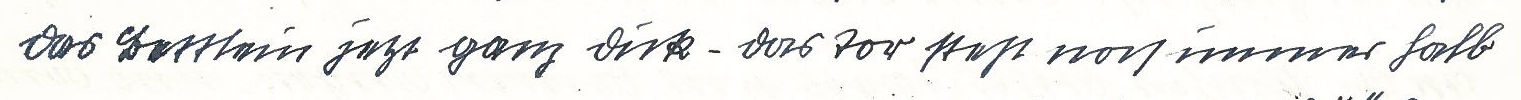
das Bettlein jetzt ganz dick – das Tor steht noch immer halb
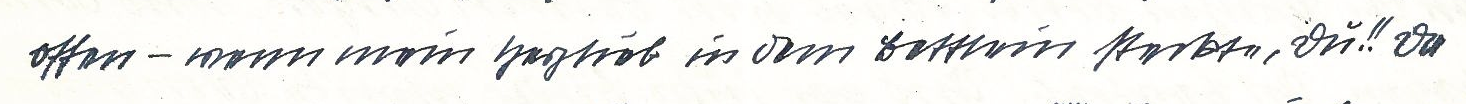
offen – wenn mein Herzlieb in dem Bettlein steckte, Du!! Da
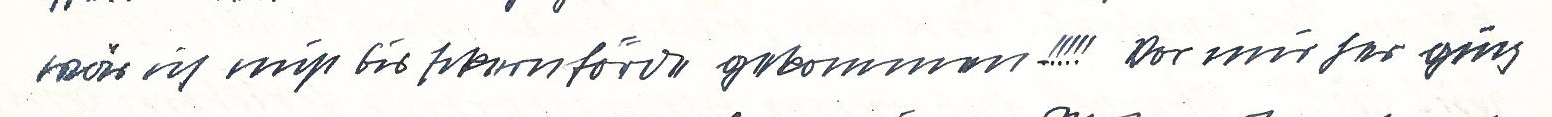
wär ich nicht bis Eckernförde gekommen!!!!! Vor mir her ging
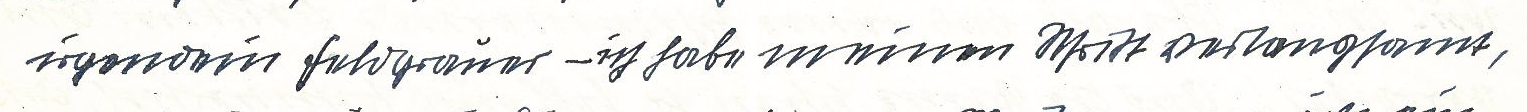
irgendein Feldgrauer – ich habe meinen Schritt verlangsamt,
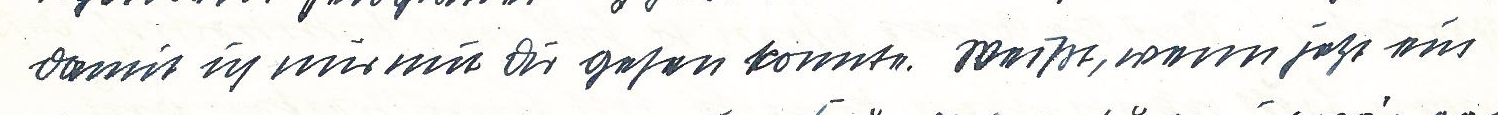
damit ich nur mit Dir gehen konnte. Weißt, wenn jetzt ein
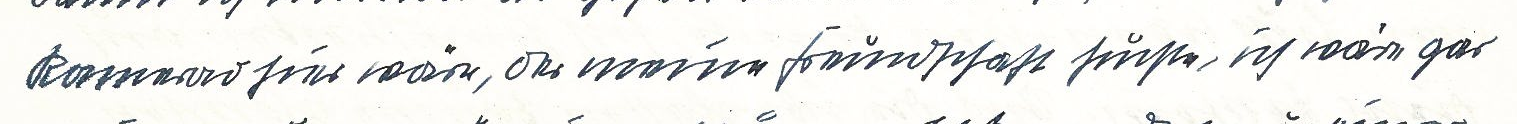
Kamerad hier wäre, der meine Freundschaft suchte, ich wäre gar
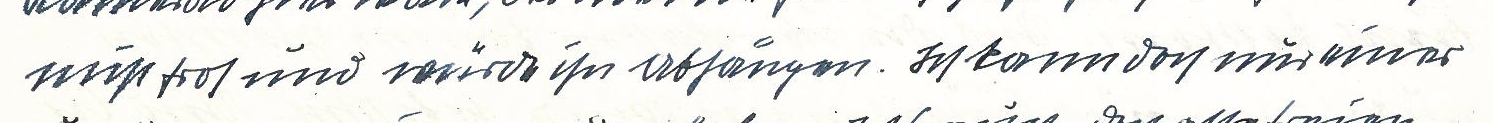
nicht froh und würde ihn abhängen. Ich kann doch nur einer
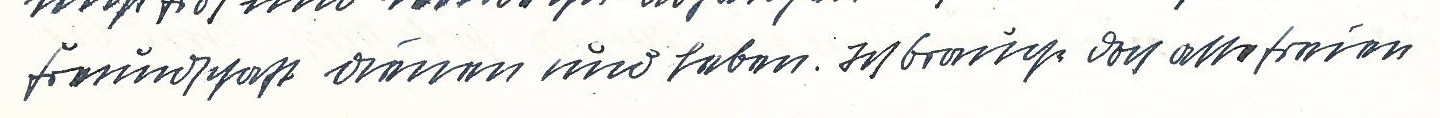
Freundschaft dienen und leben. Ich brauche doch alle freien
